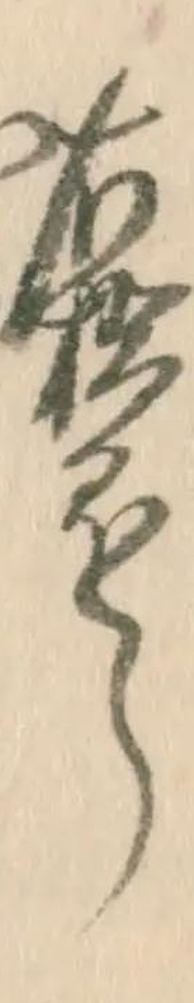右橋懸り
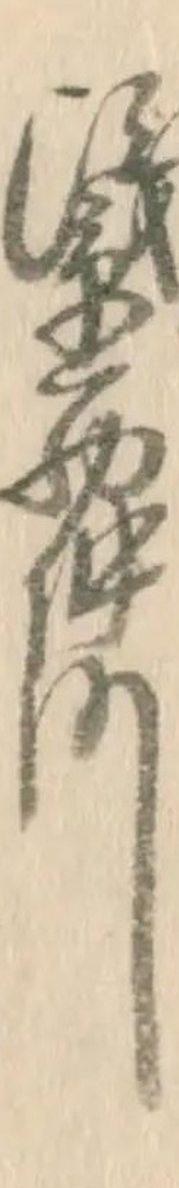浅草西仲町
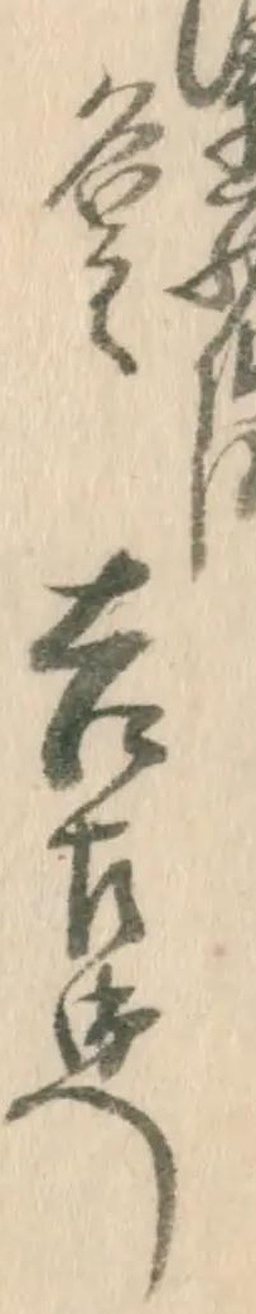名主吉左衛門
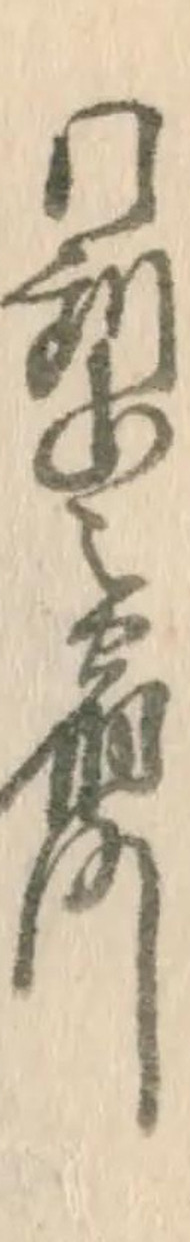同所山之宿町
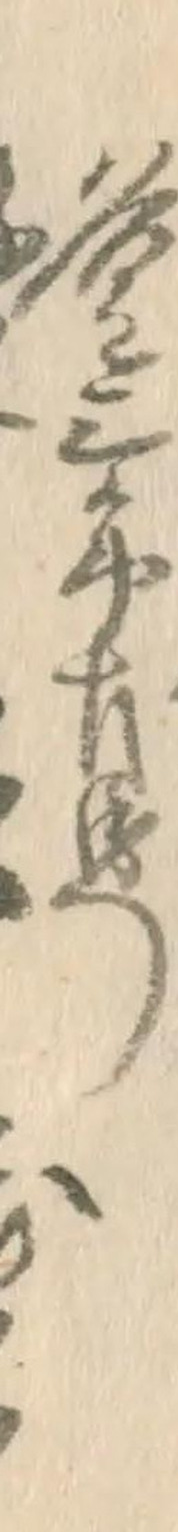名主三郎左衛門
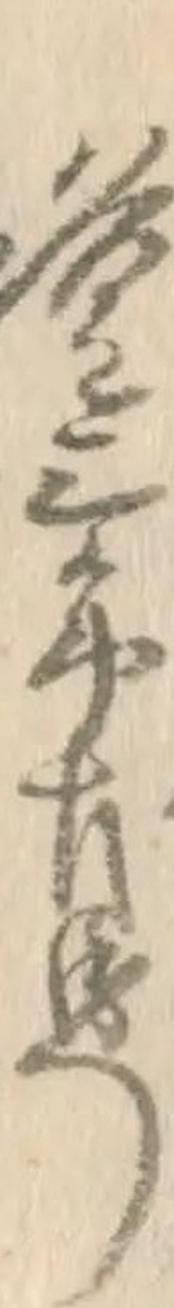名主三郎左衛門
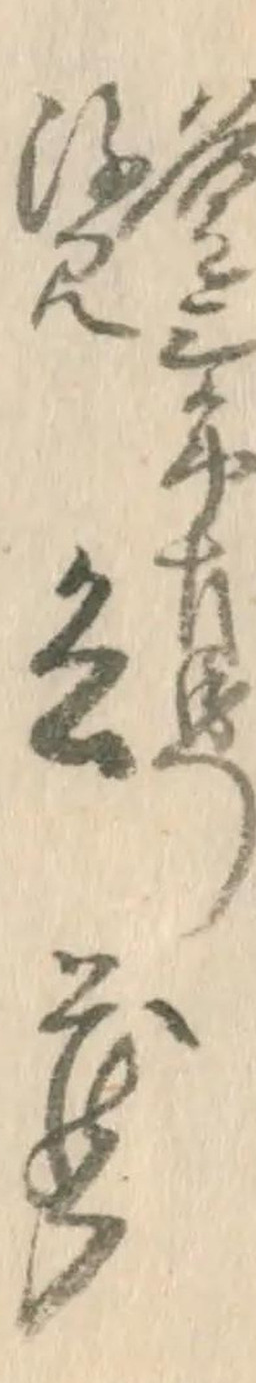後見兵蔵
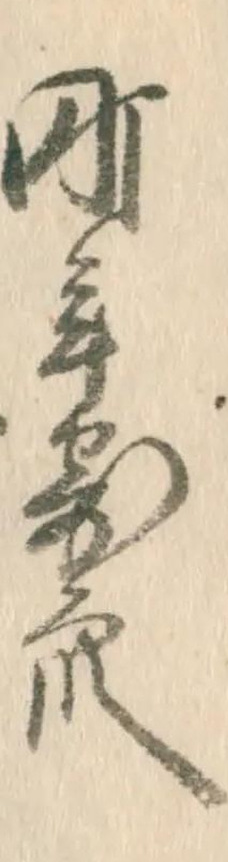町年寄衆
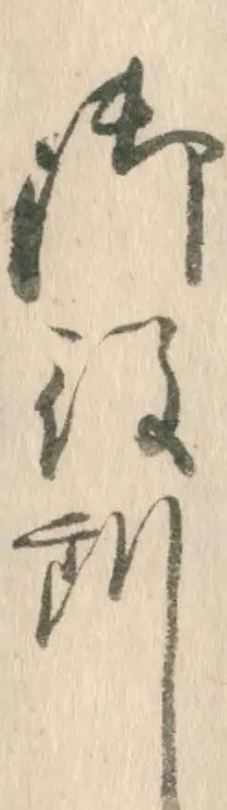御役所

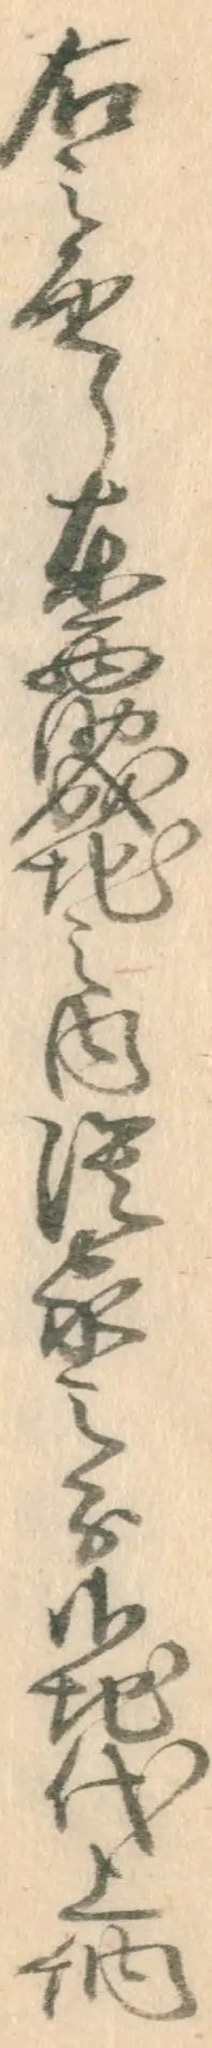右之通り東西助成地之内潰家之分御地代上納
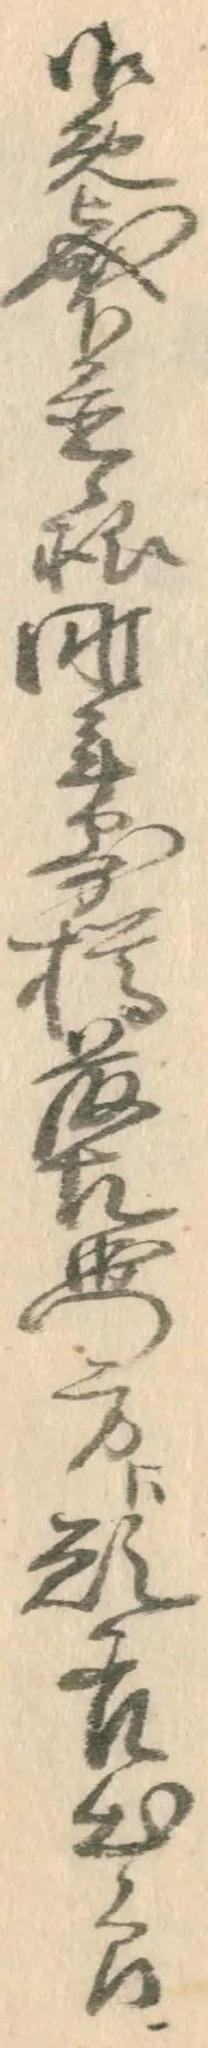御免被成下置候様町年寄樽藤左衛門方え願差出候間
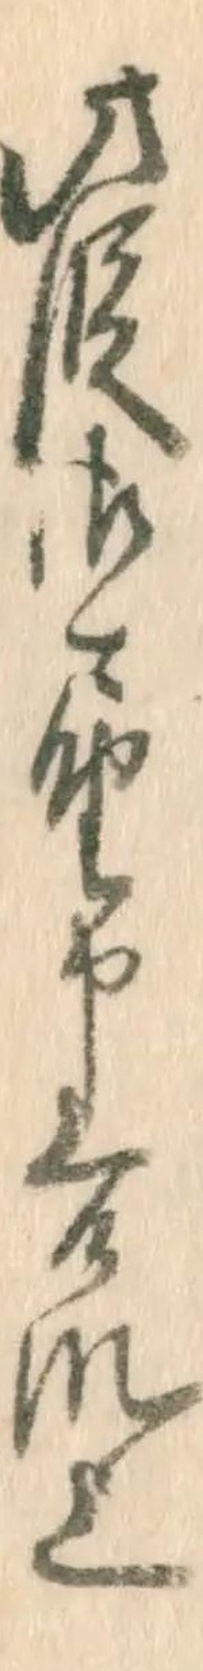此段御届申上候以上
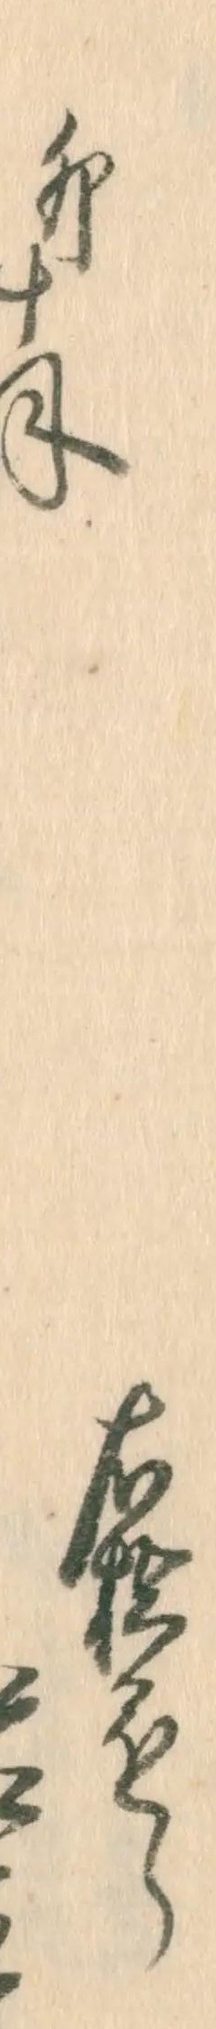卯十月右橋懸り
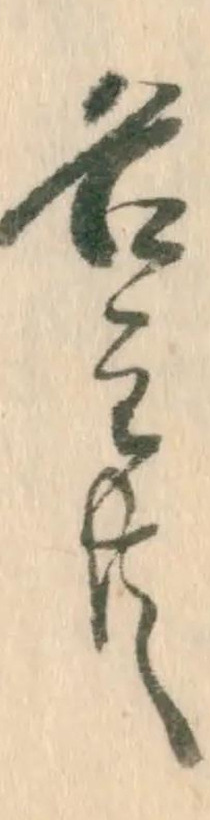名主共
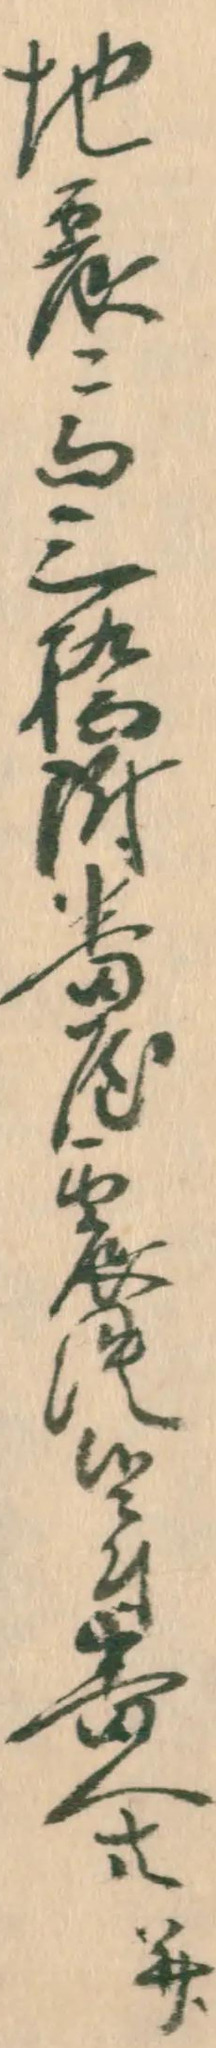地震ニ而三橋附番屋震潰候ニ付番人共并
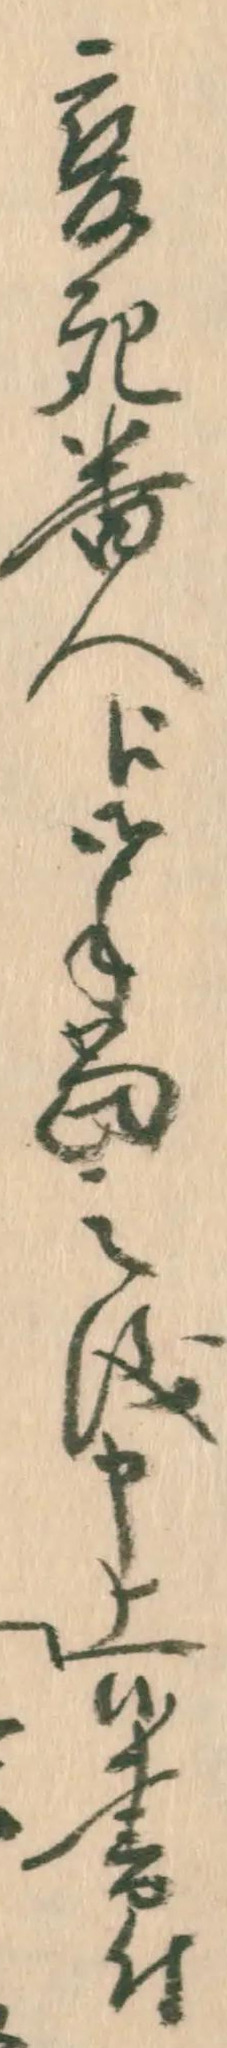変死番人え御手当之儀申上候書付
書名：三橋 17巻. [8] 三橋小破御修復書留　但御奉行御掛リ替地震潰橋番屋　嘉永四亥年より安政二卯年迄　下
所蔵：国立国会図書館 National Diet Library, JAPAN
